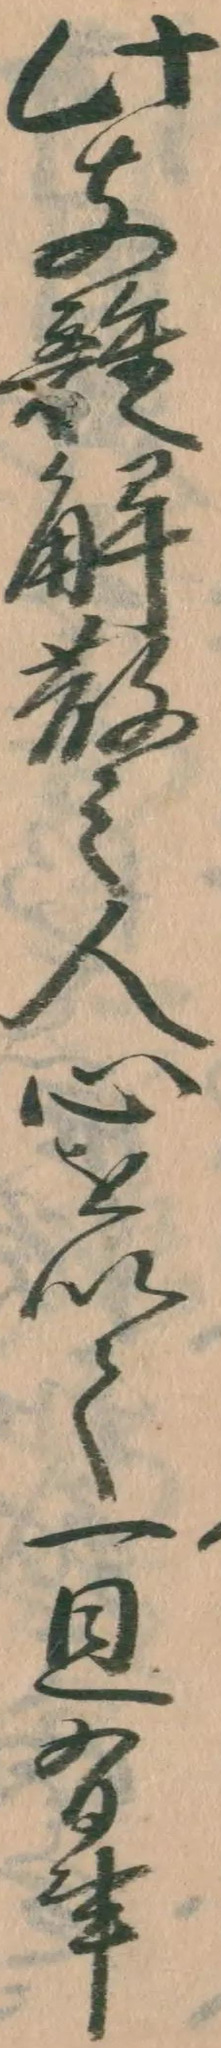此支離解散之人心を以て一旦有事
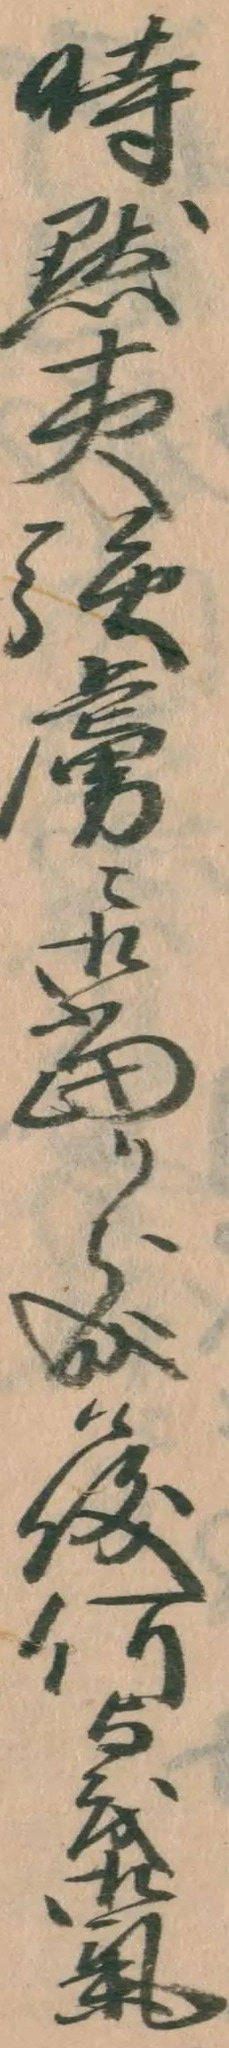時黙夷強虜ニ御當り被成候儀何とも御氣
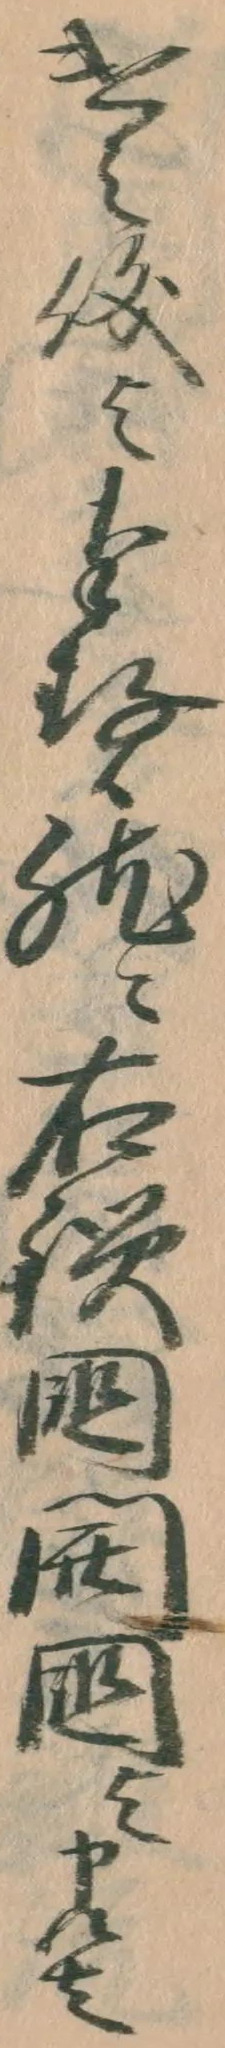遣之儀と奉存候然ニ右鎖国開国と申候は
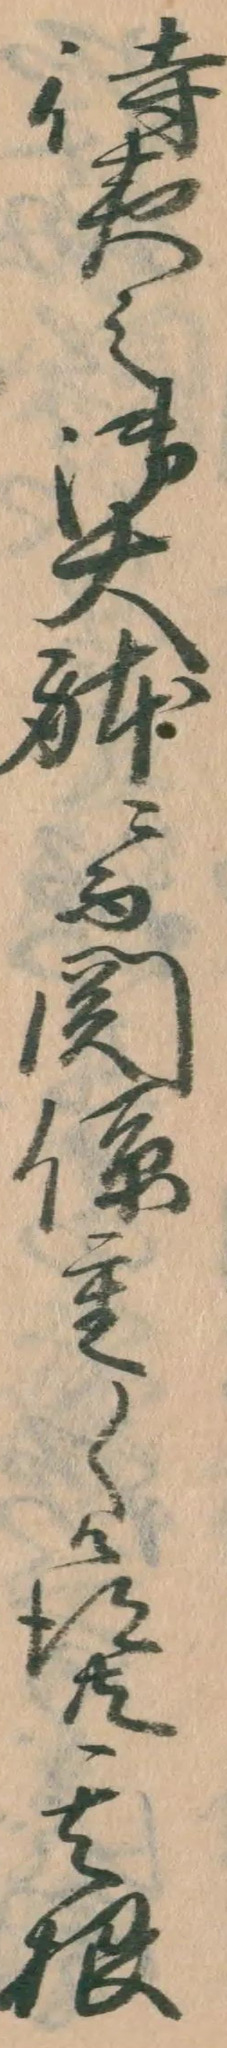待夷之御大躰ニ而関係重く候得共其根
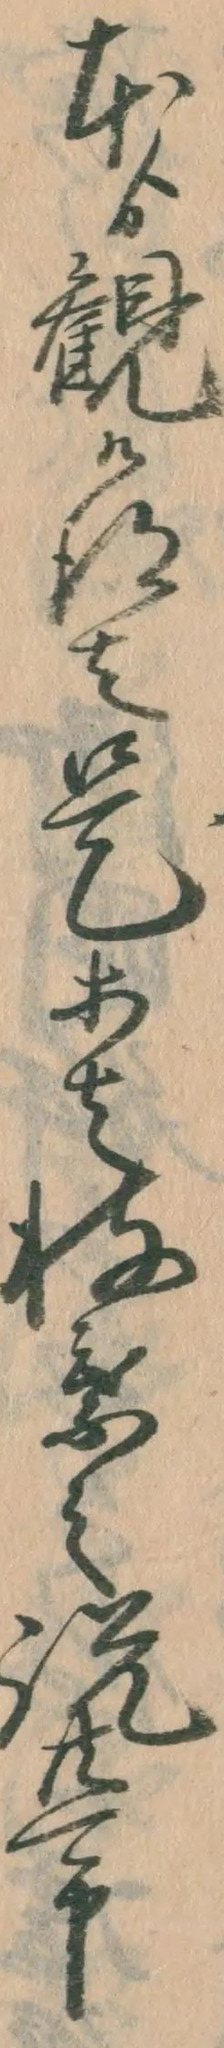本より観候得者是等者枝葉之説共可申
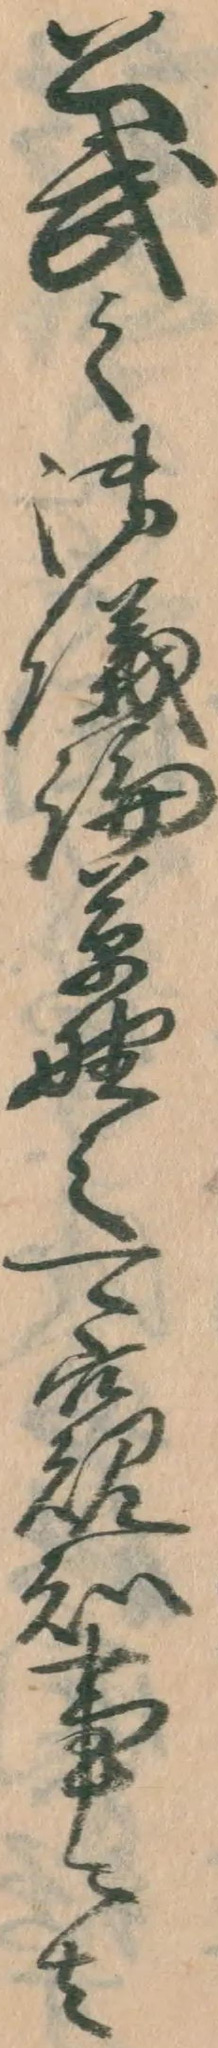公武之御議論草野之可窺知事ニは
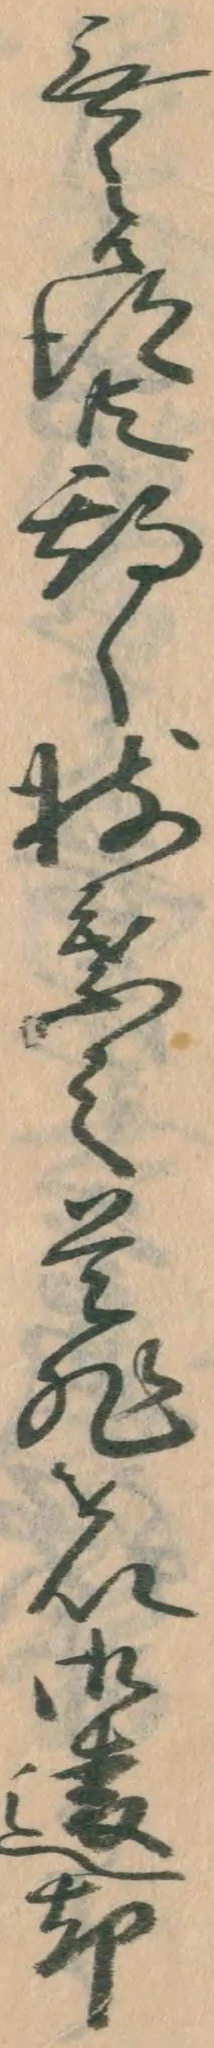無之候得共斯〱枝葉之是非を以御違却
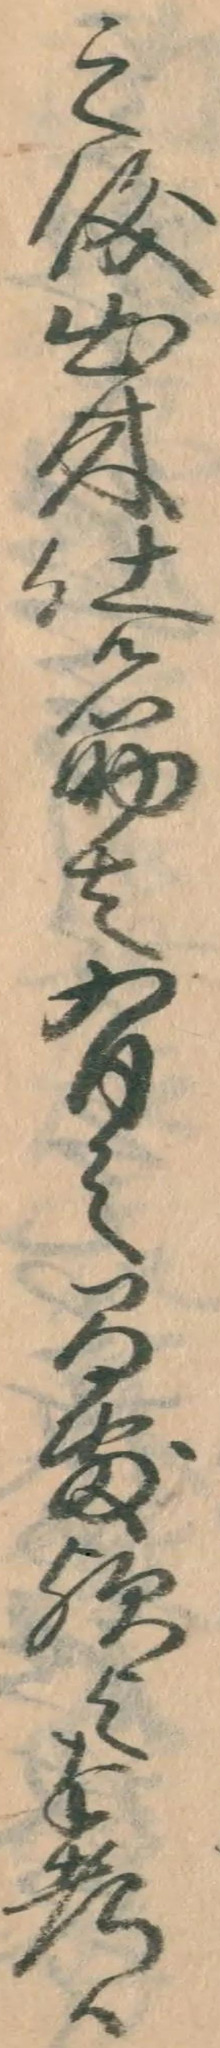之儀出来仕候筋は有之間敷歟と奉考候

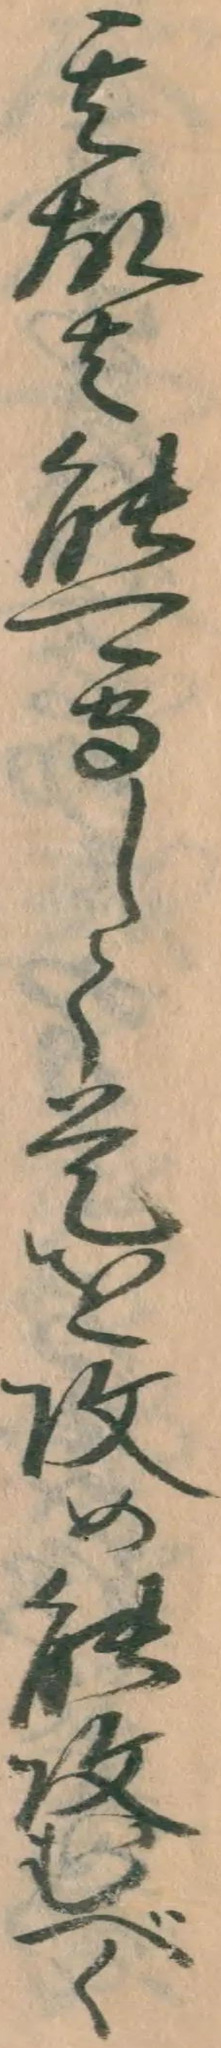其故者能可守して是を攻め能攻むべく
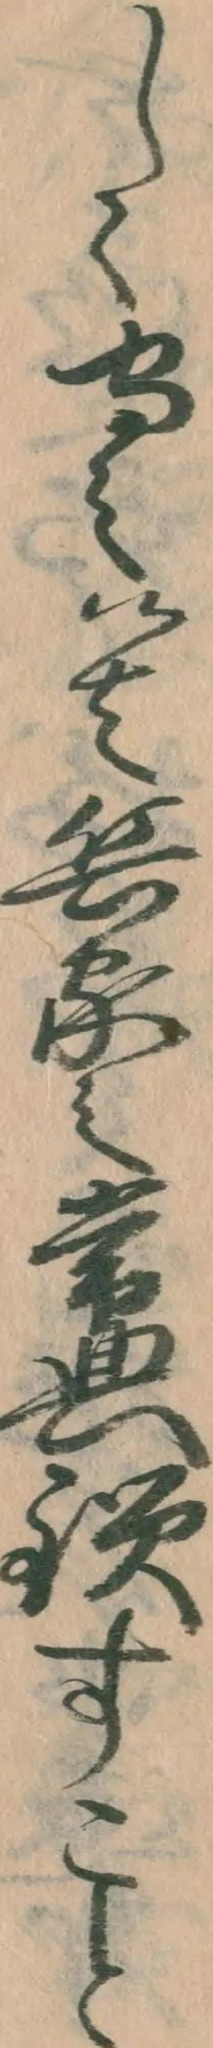して守之候者兵家之常典鎖すこと
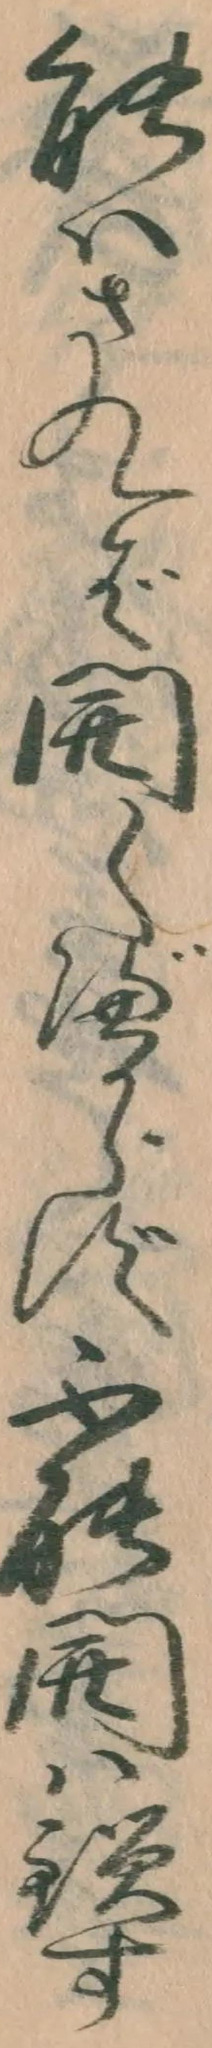能はされば開くべからず不能開ハ鎖す
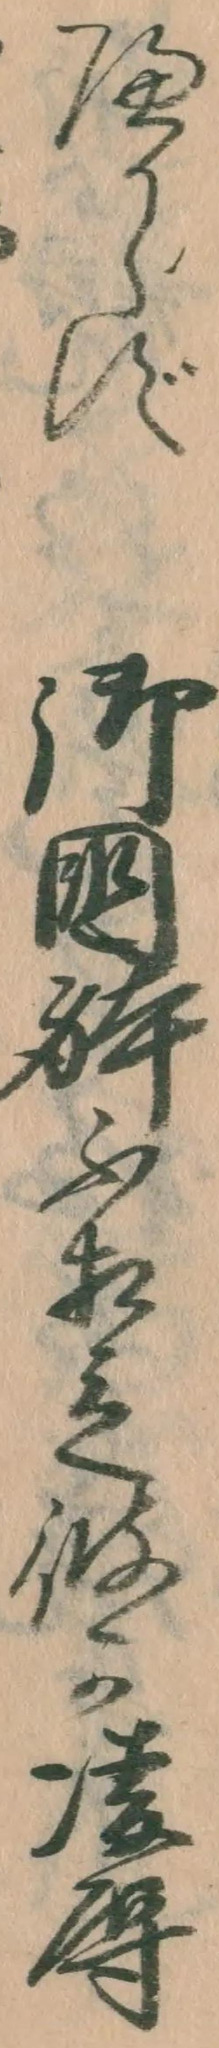へからず御国躰不相立彼か凌辱
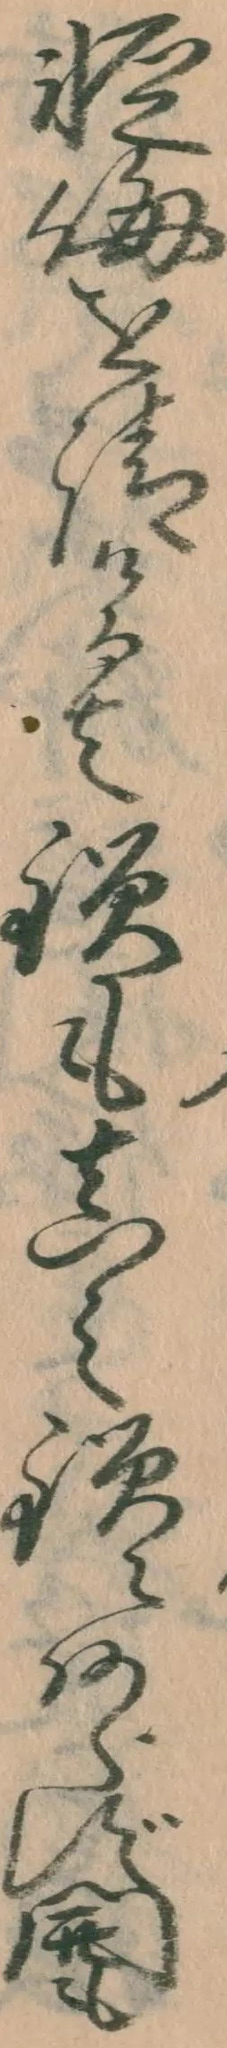軽悔を請候而者鎖も真の鎖ニあらず開も
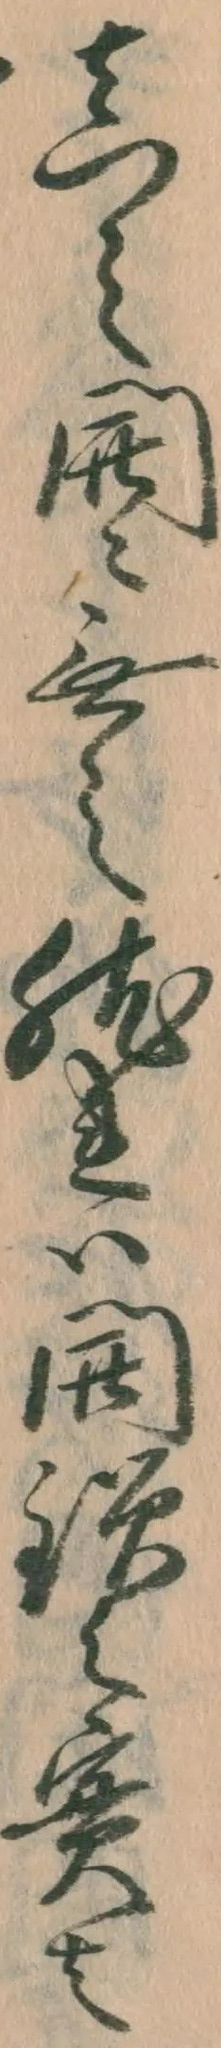真の開ニ無之然れハ開鎖之實者
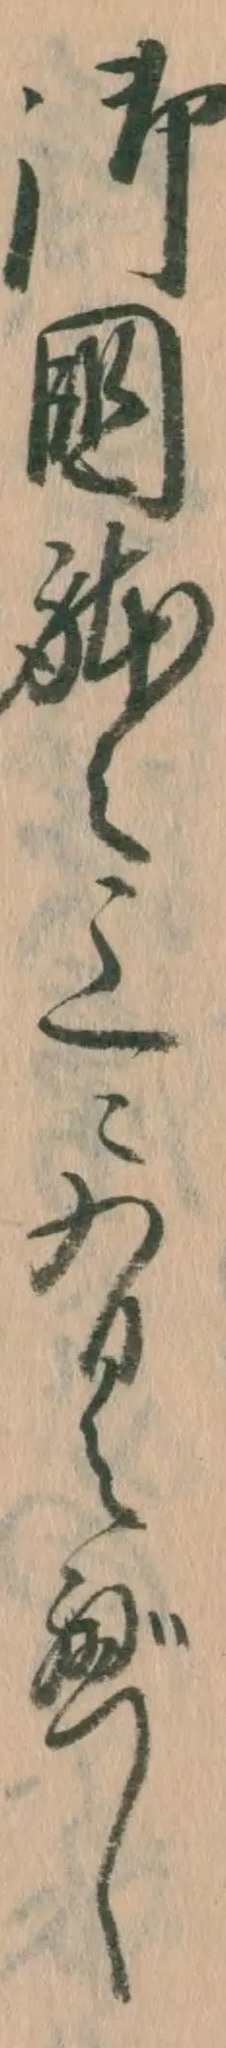御国躰之上ニ有之べし
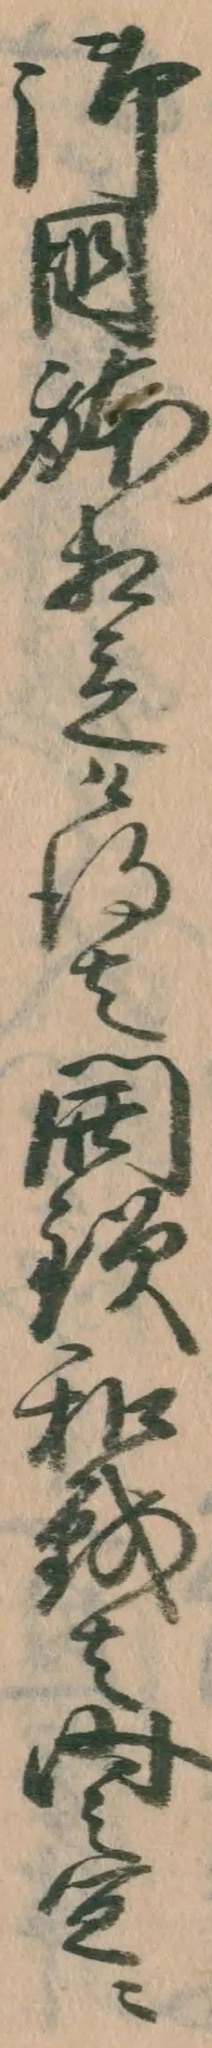御国躰相立候得者開鎖和戦者時之宜ニ
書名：麗斎叢書. 20
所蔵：国立国会図書館 National Diet Library, JAPAN
